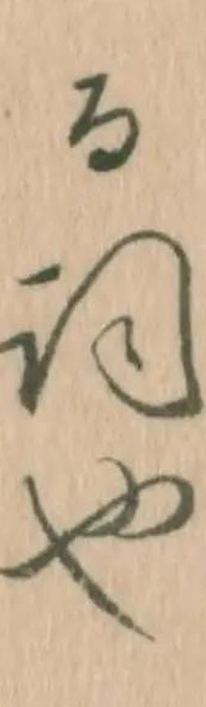る詞也
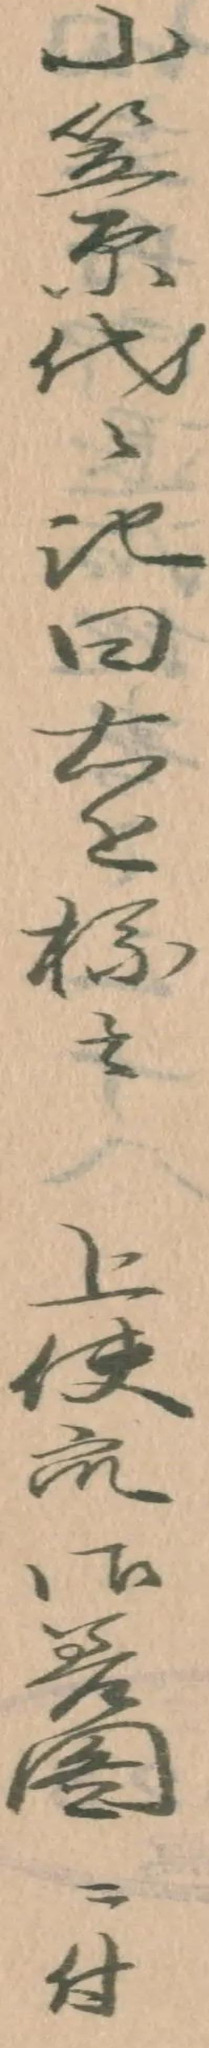小笠原代々記曰右近様之上使衆御差図に付
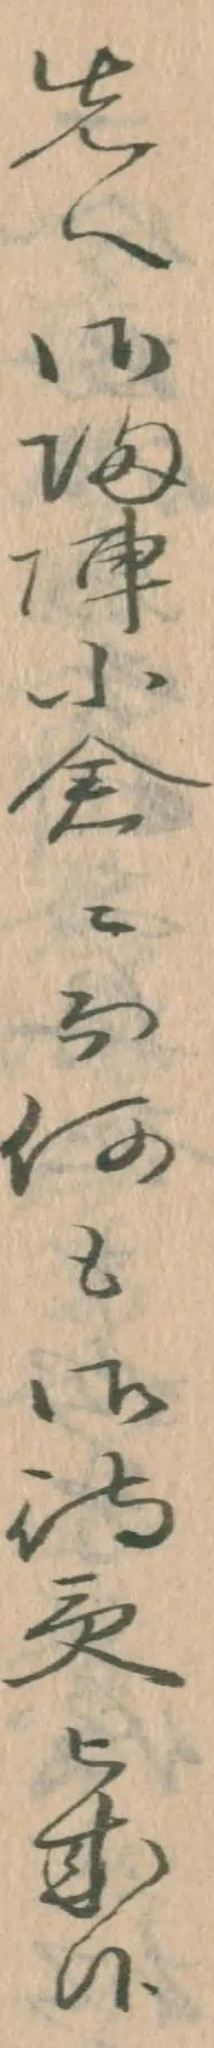先へ御帰陣小倉に而何も御待受被成候
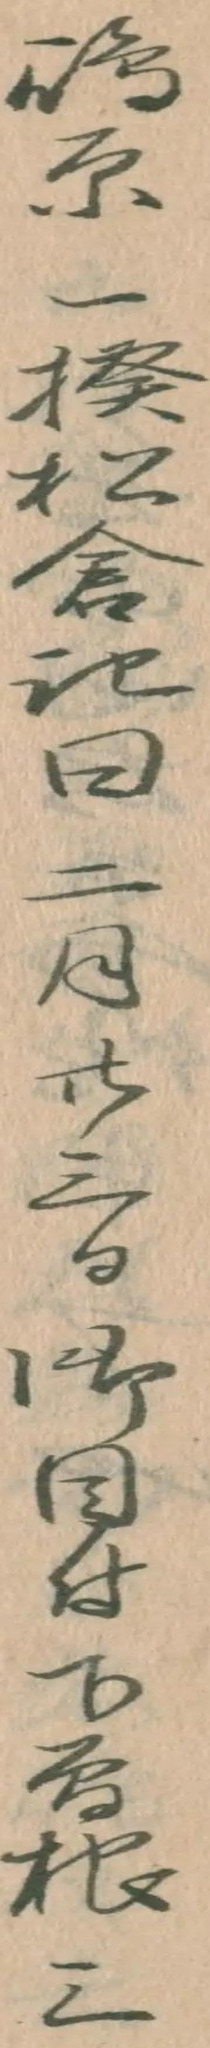島原一揆松倉記曰二月廿三日御目付下曽根三
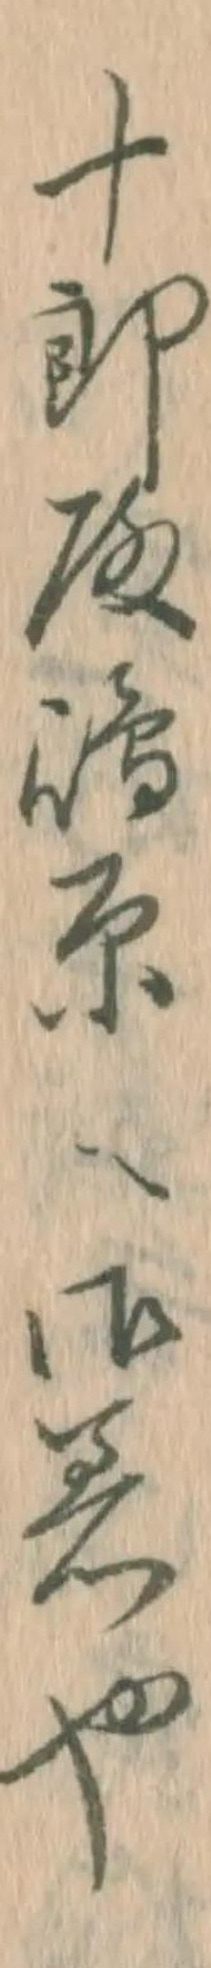十郎殿島原へ御着也
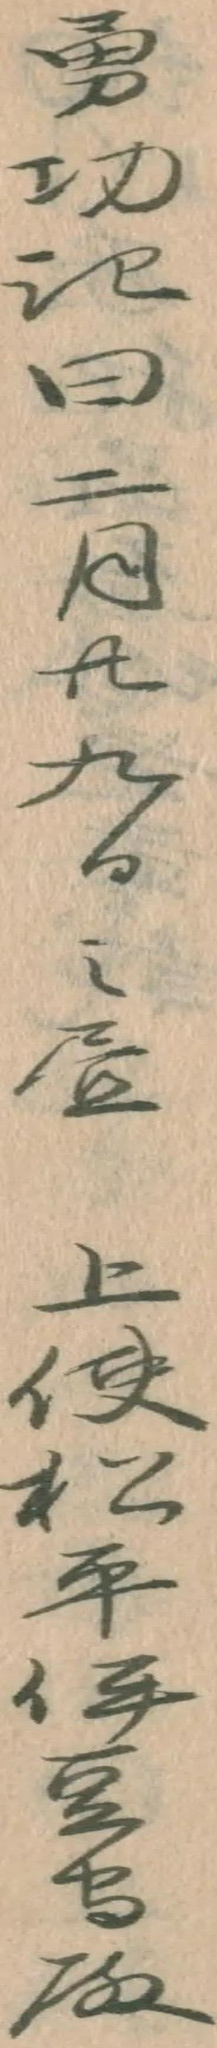勇功記曰二月廿九日之昼上使松平伊豆守殿
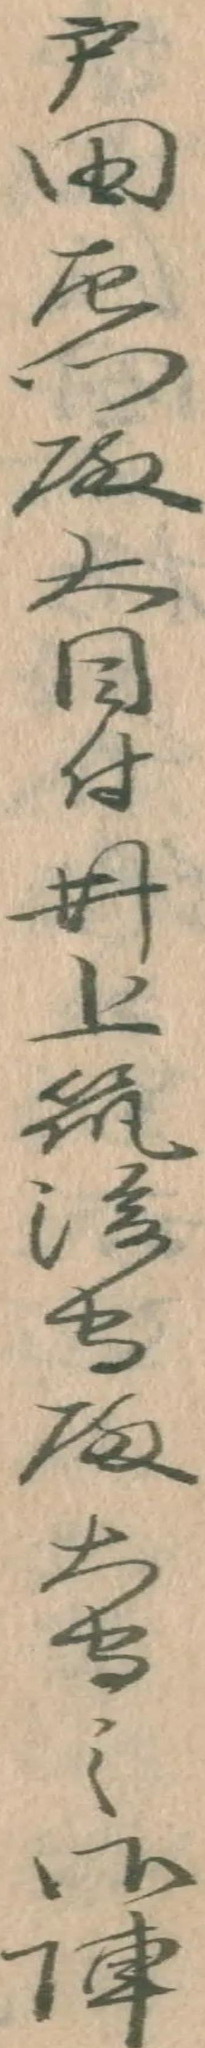戸田左門殿大目付井上筑後守殿大守之御陣
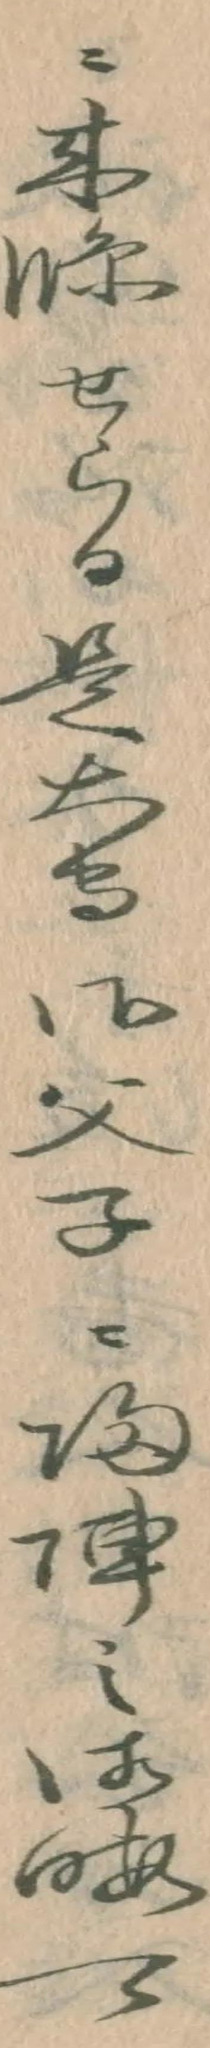に来條せらる是大守御父子に帰陣之御暇可
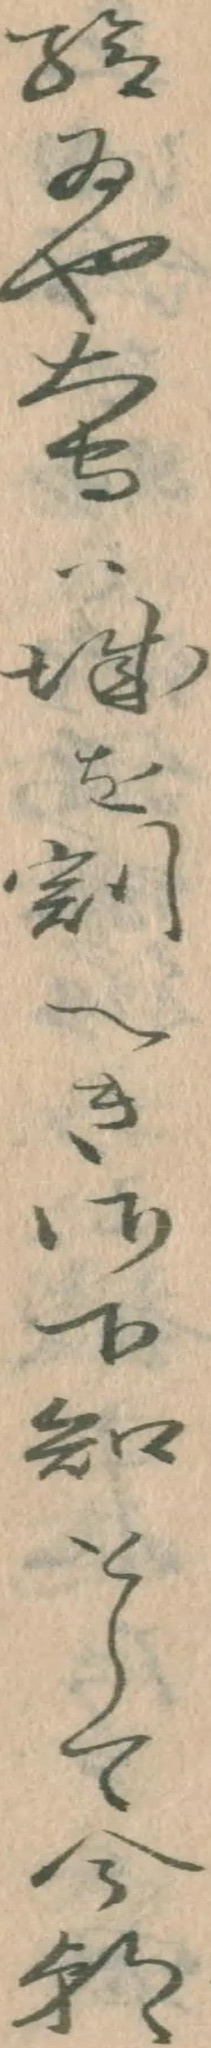給ゐ也大守は城を割へき御下知として今朝
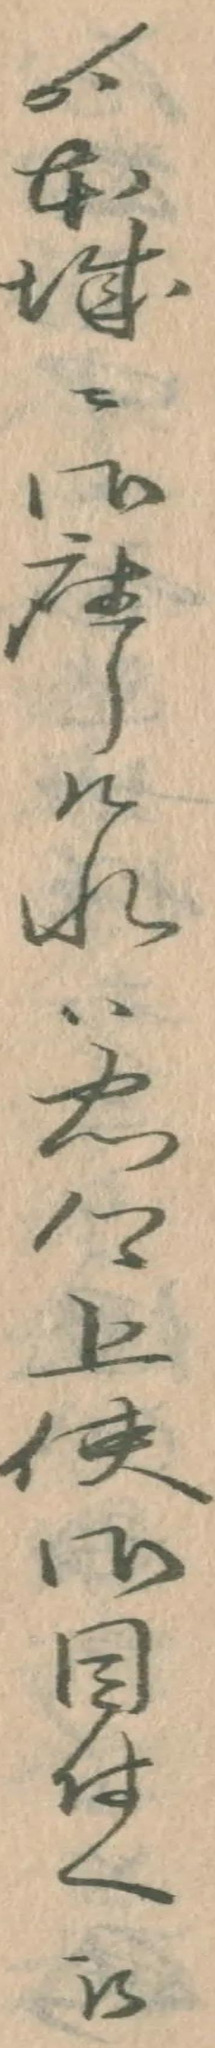ゟ本城に御座しけれは忠郷上使御目付へ被
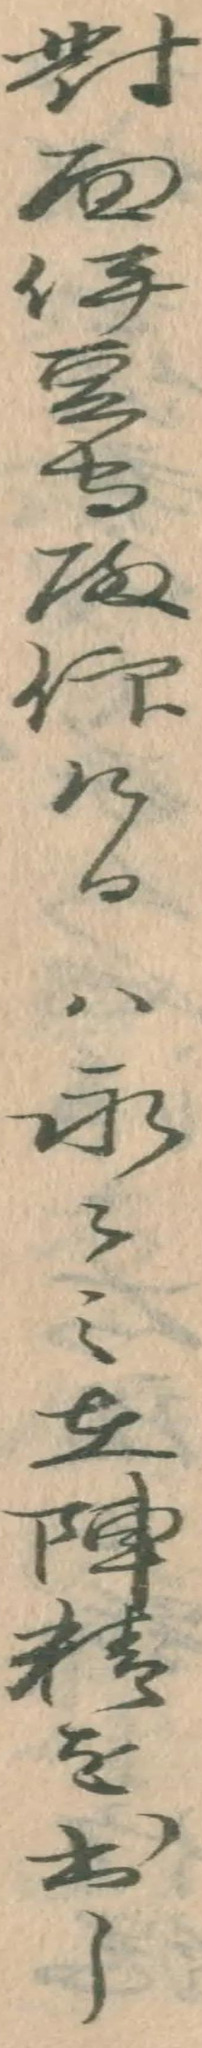対面伊豆守殿仰けるは永々之本陣精を出し
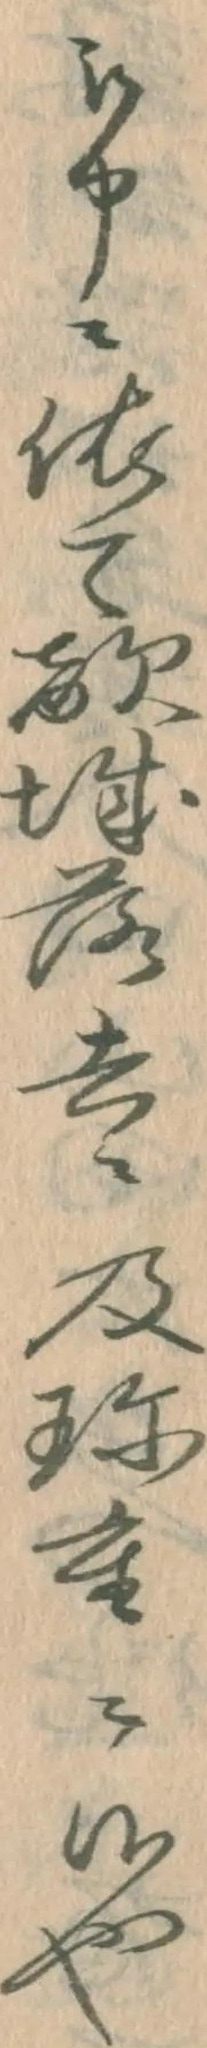被申に依て敵城落去に及珍重に候也

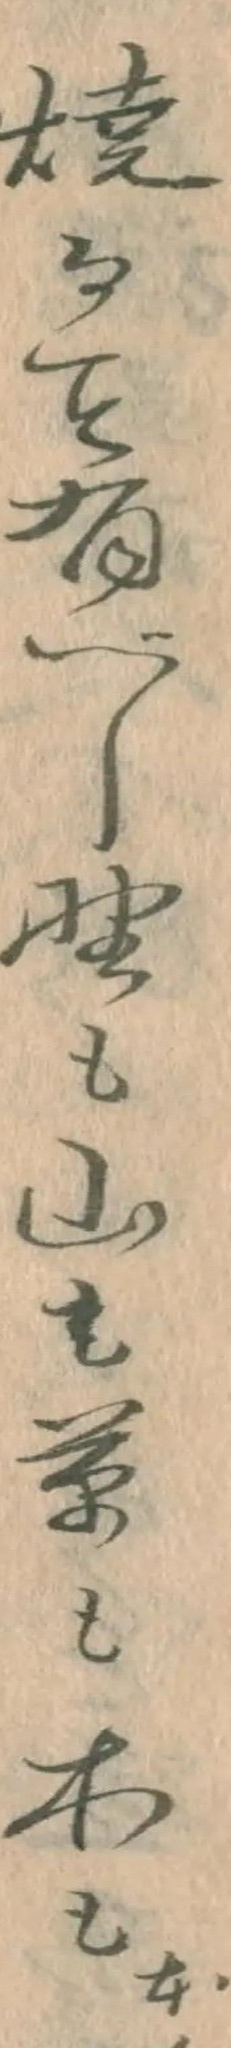焼るを有べし野も山も草も木も
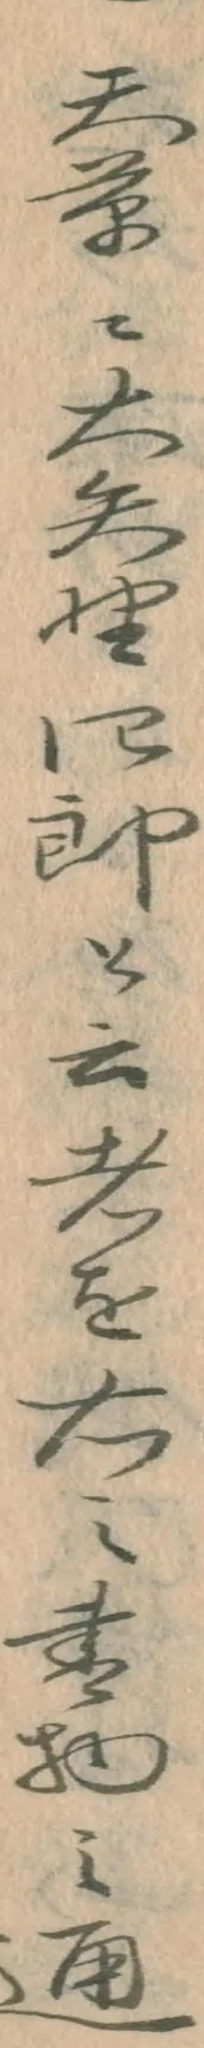一天草に大矢野四郎と云者を右之書物之通
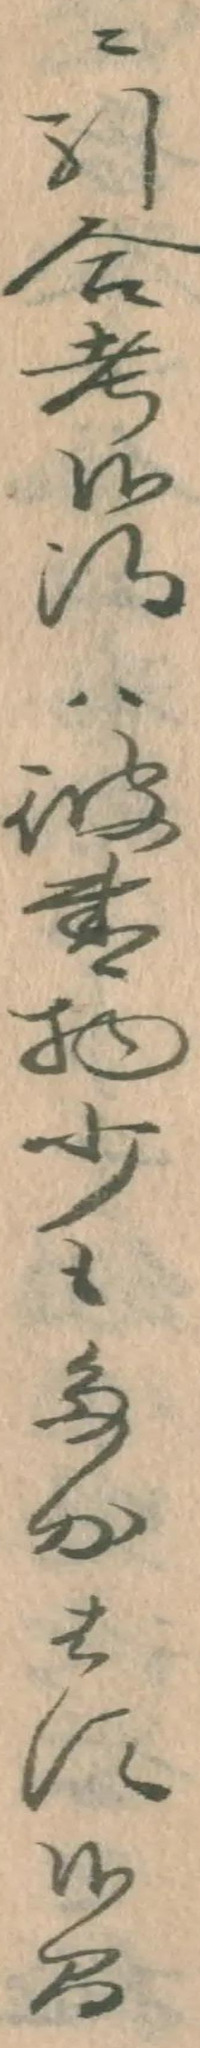に引合考候得は彼書物少も多か者須候間
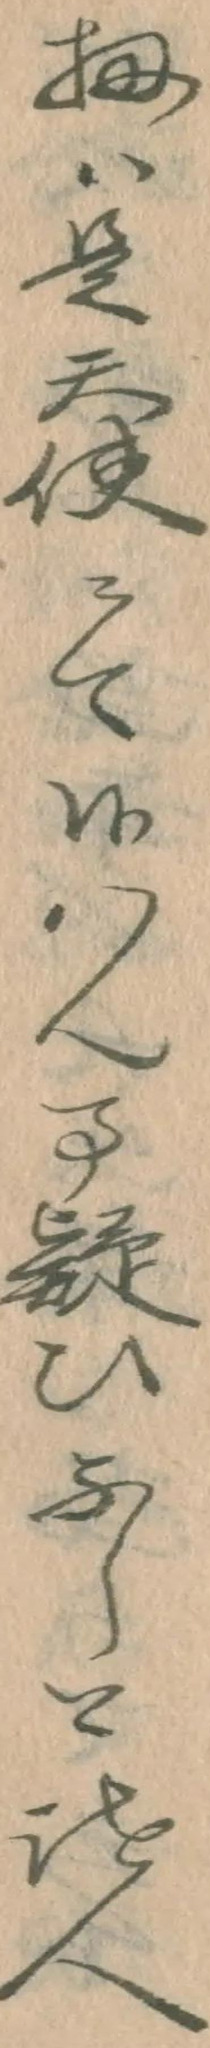扨は是天使にて候はん事疑ひなしと諸人
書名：切支丹御退治記 49巻. [9]
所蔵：国立国会図書館 National Diet Library, JAPAN
